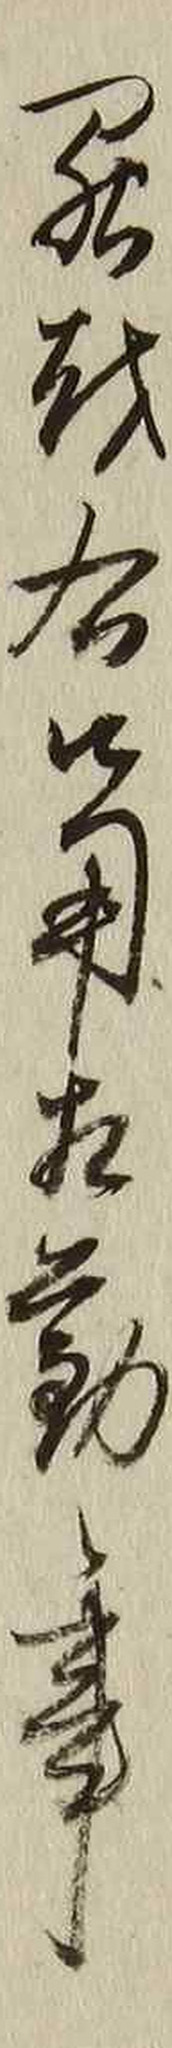罷越右御用相勤候事
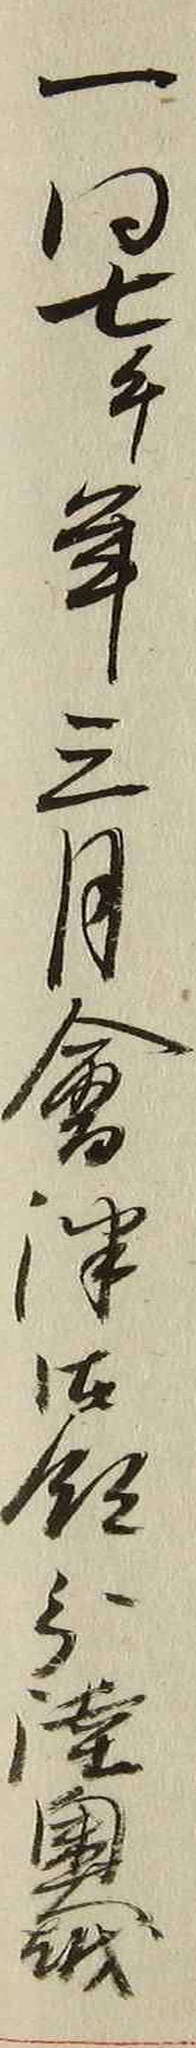一同七午年三月会津御領分陸奥越
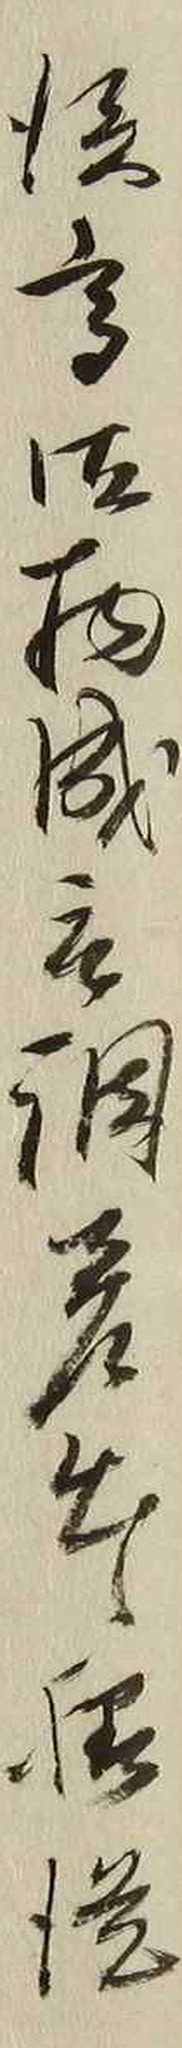後高御物成取調差出候様従
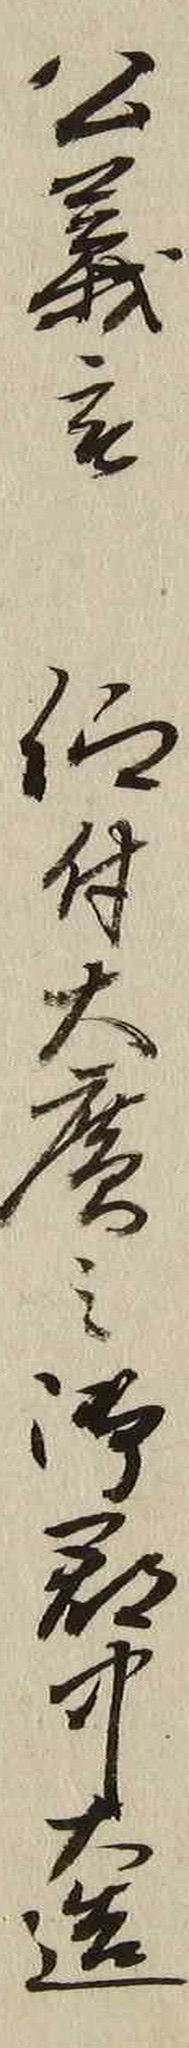公義被仰付大広之御郡中大造
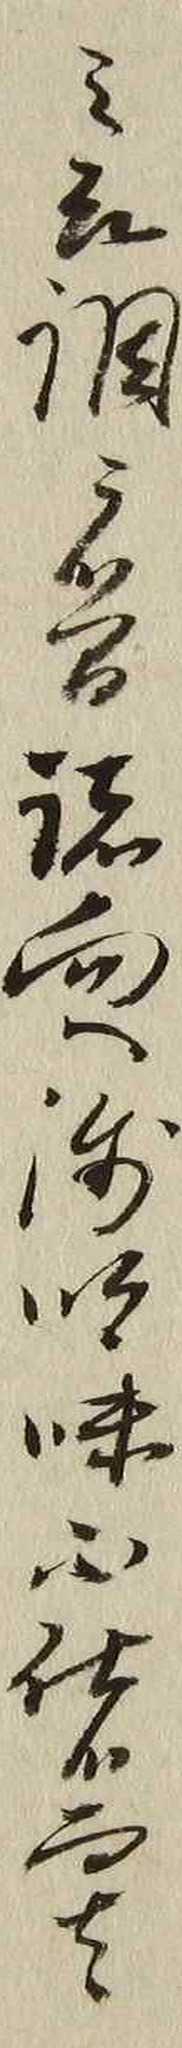之取調ニ候間諸向へ渉吟味不仕候而者
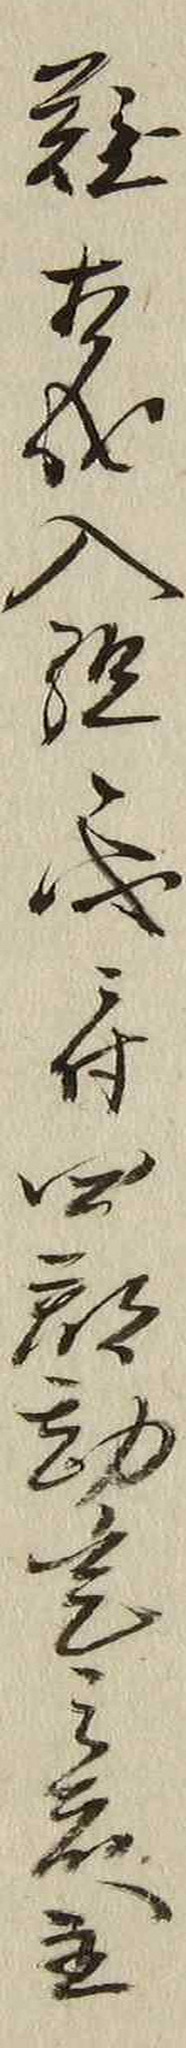難相成入組候儀ニ付四郡勘定之者へ主
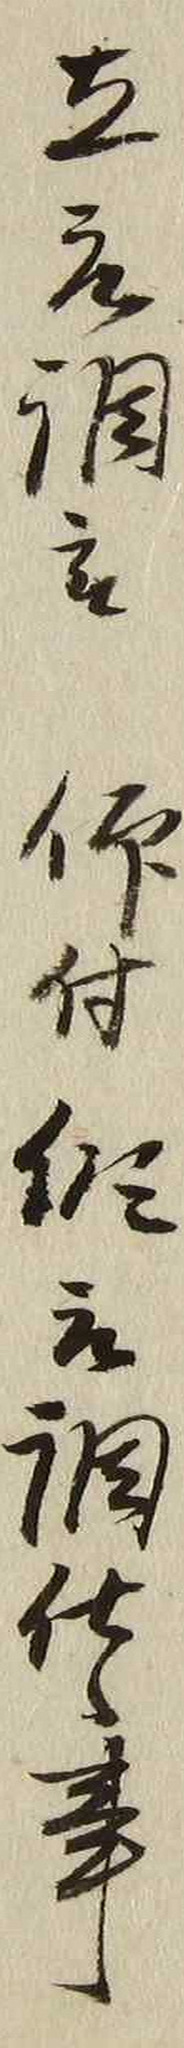立取調被仰付儘取調仕候事
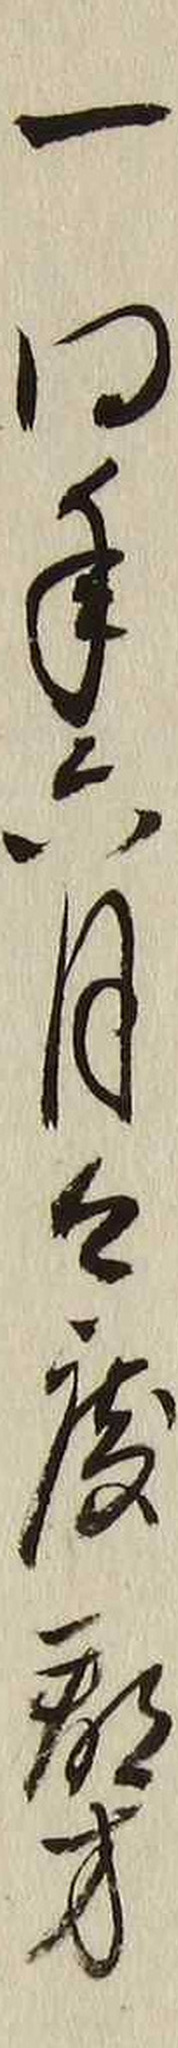一同年六月今度郡方
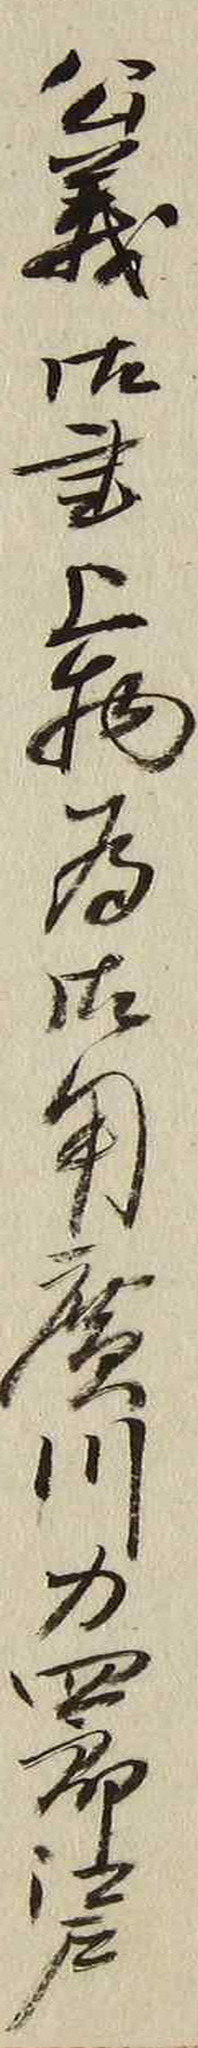公義御書上物為御用広川力四郎江戸
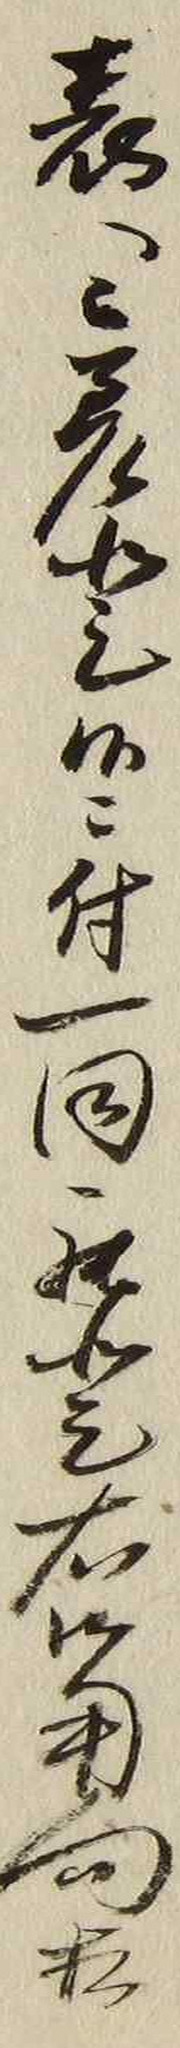表へ被差登候ニ付一同罷登右御用向相
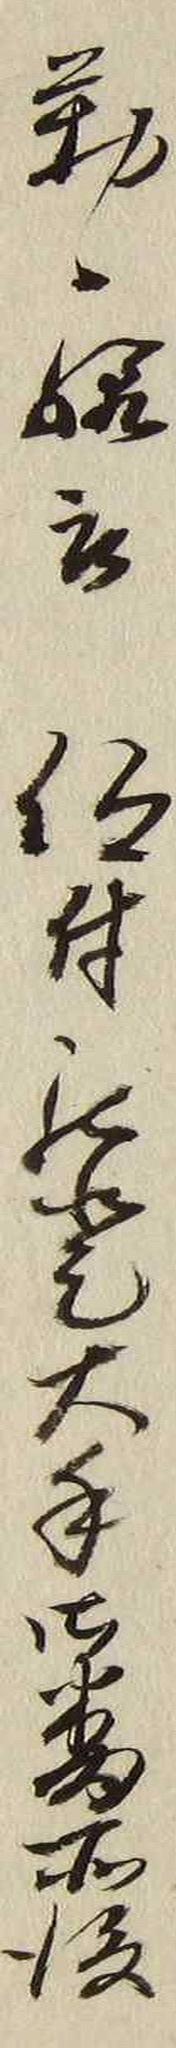勤候様被仰付罷登大手御番所後
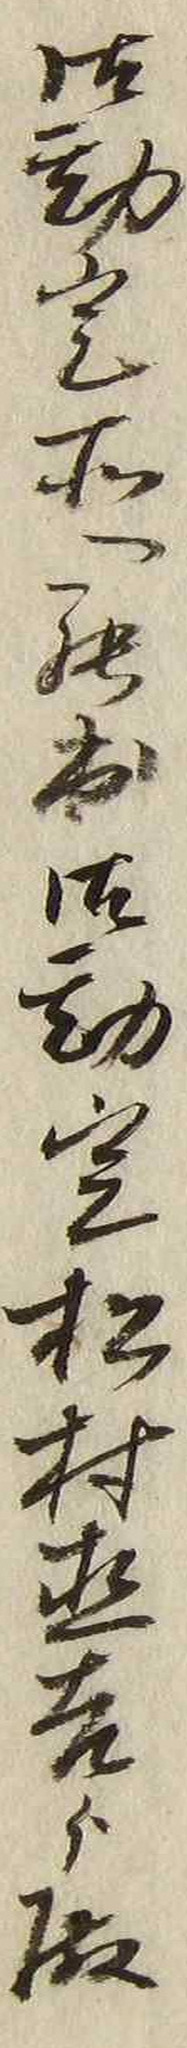御勘定所へ罷出御勘定松村直吉郎殿

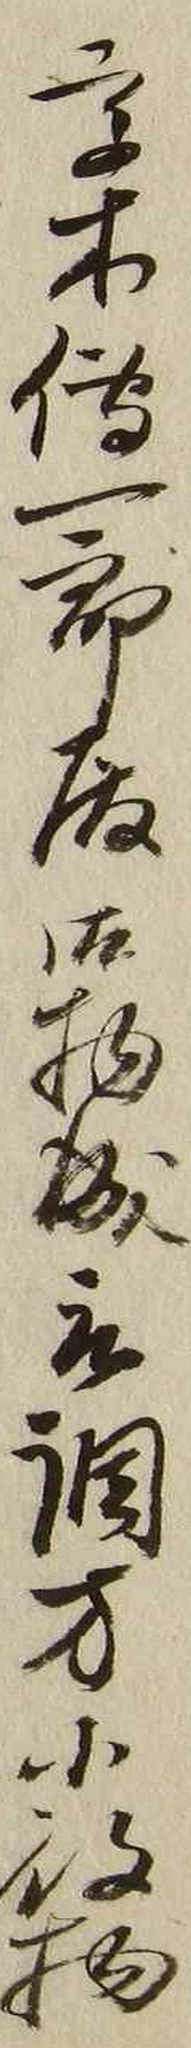高木伝一郎殿御物成取調方小役物
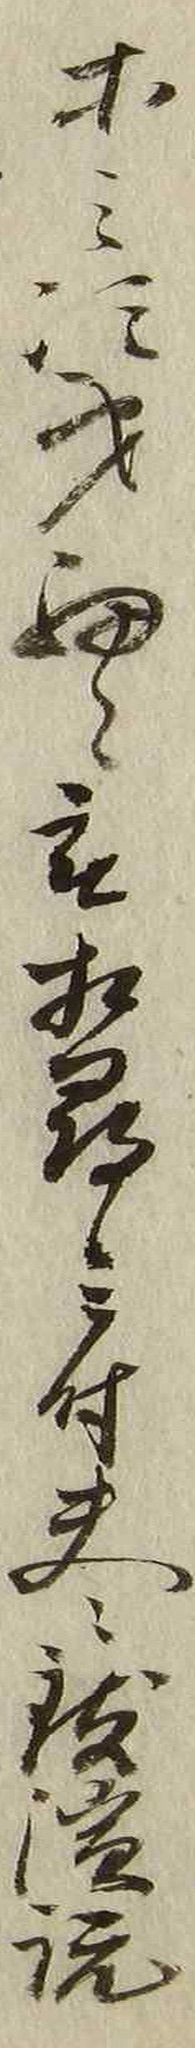等之次第細々被相尋候ニ付夫々致演説
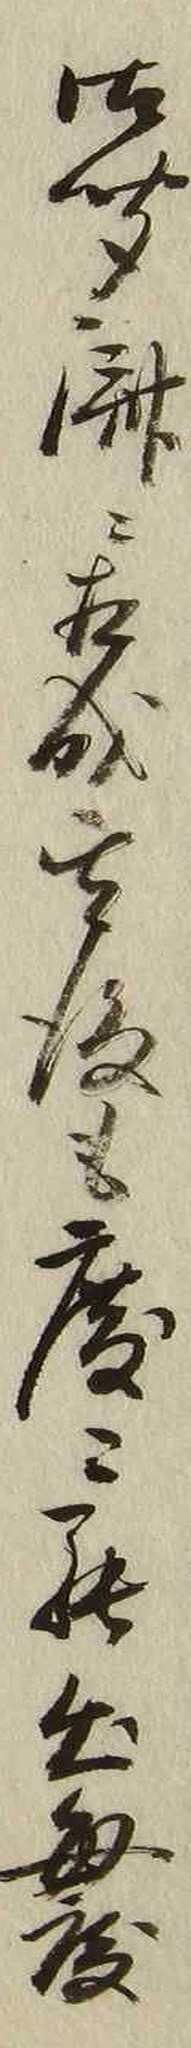御聞済ニ相成其後も度々罷出毎度
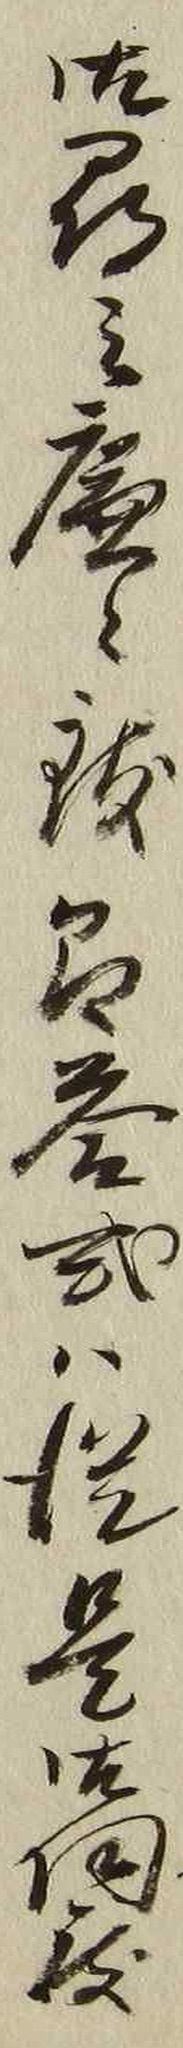御尋之廉々致間答或ハ従是御伺度
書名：諸士系譜　巻之352　す之部2
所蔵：会津若松市立会津図書館
